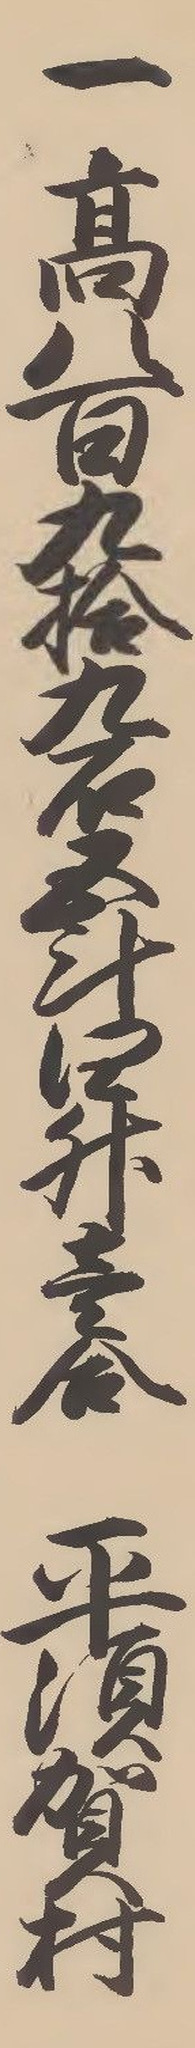一高八百九拾九石五斗四升壱合平須賀村
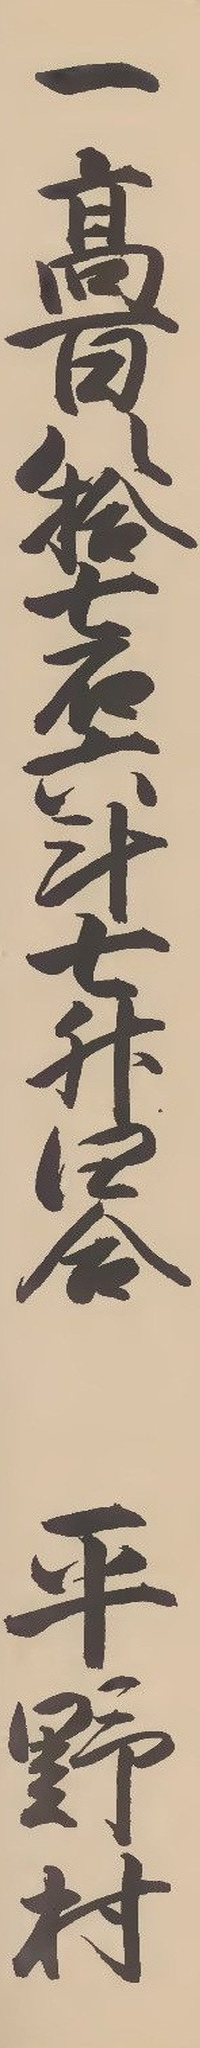一高百八拾七石六斗七升四合平野村
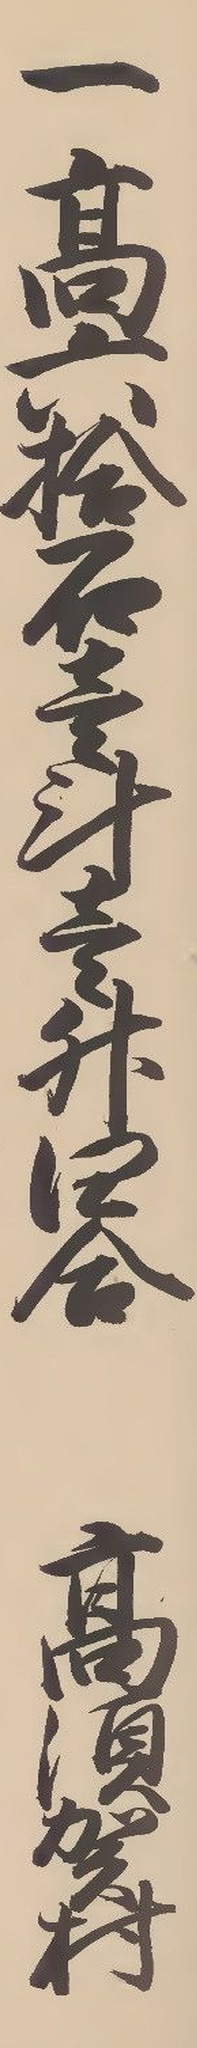一高六拾石壱斗壱升四合高須賀村
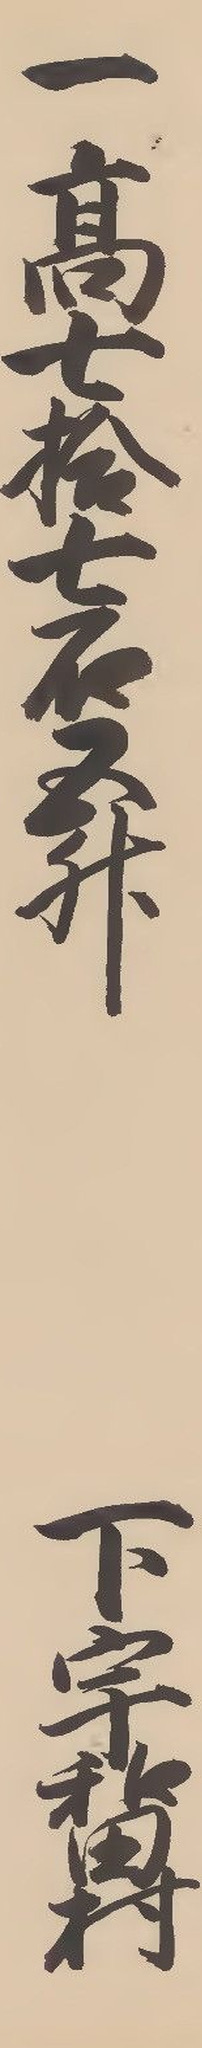一高七拾七石五升下宇和田村
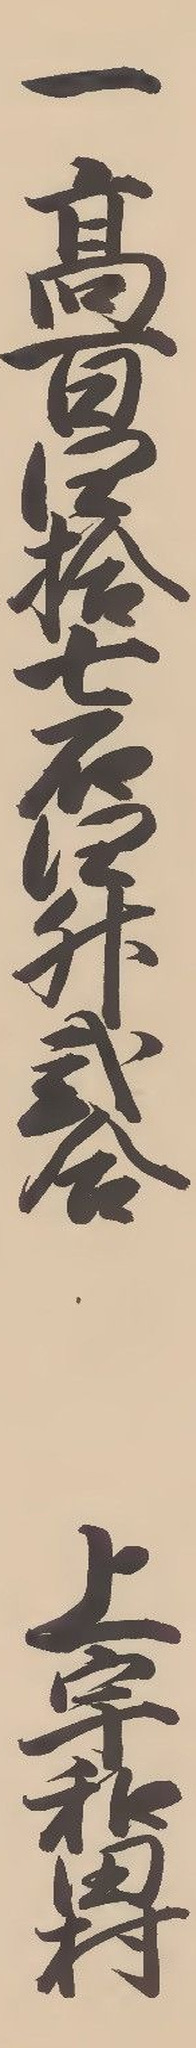一高百四拾七石四升弐合上宇和田村
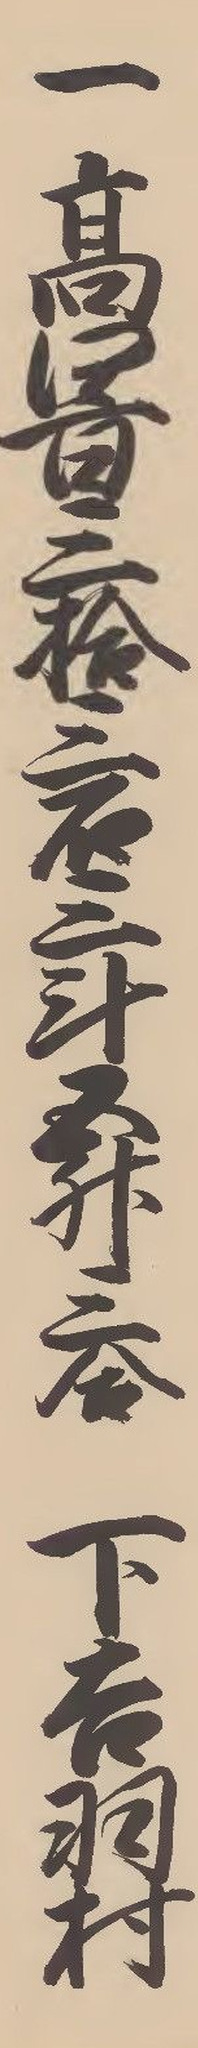一高四百三拾三石三斗五升三合下吉羽村

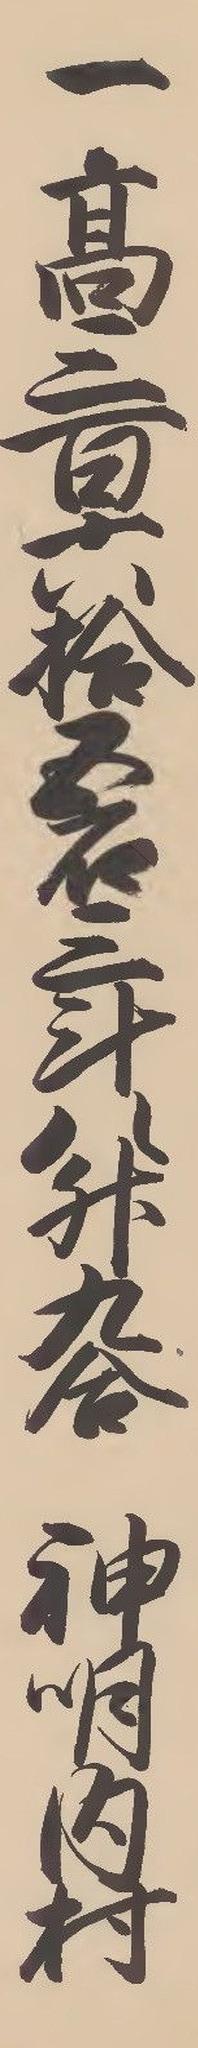一高三百六拾五石三斗八升九合神明内村
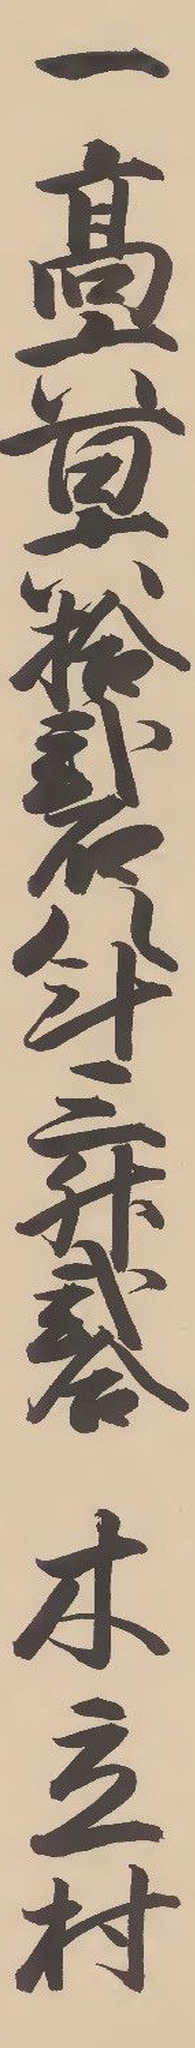一高六百六拾弐石八斗三升弐合木立村
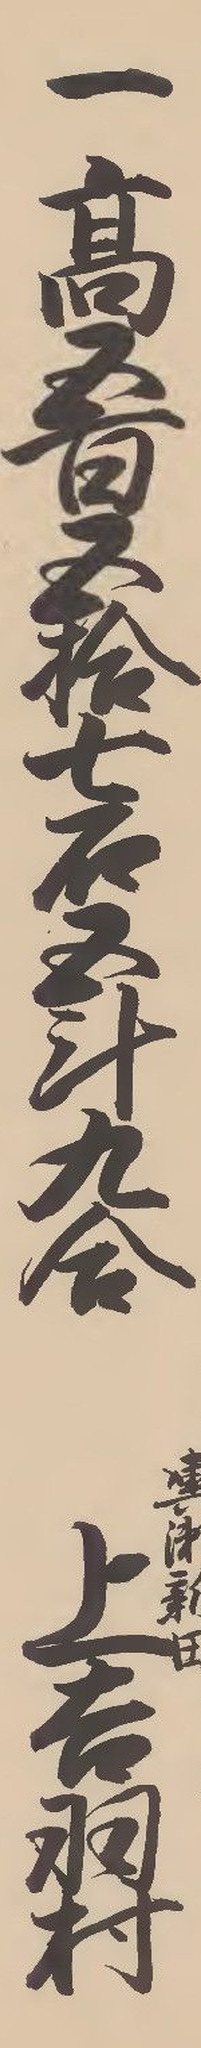一高五百五拾七石五斗九合上吉羽村
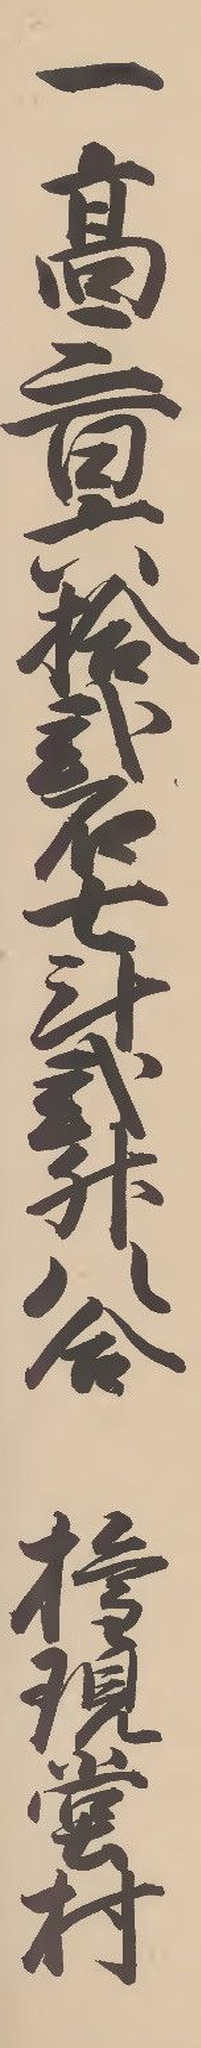一高三百六拾弐石七斗弐升八合権現堂村
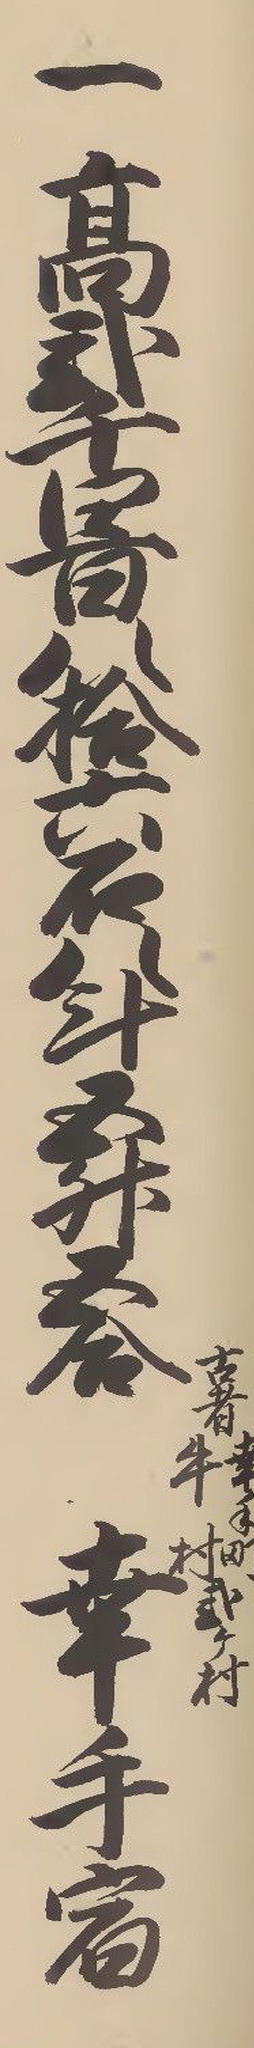一高弐千四百八拾六石八斗五升五合幸手宿
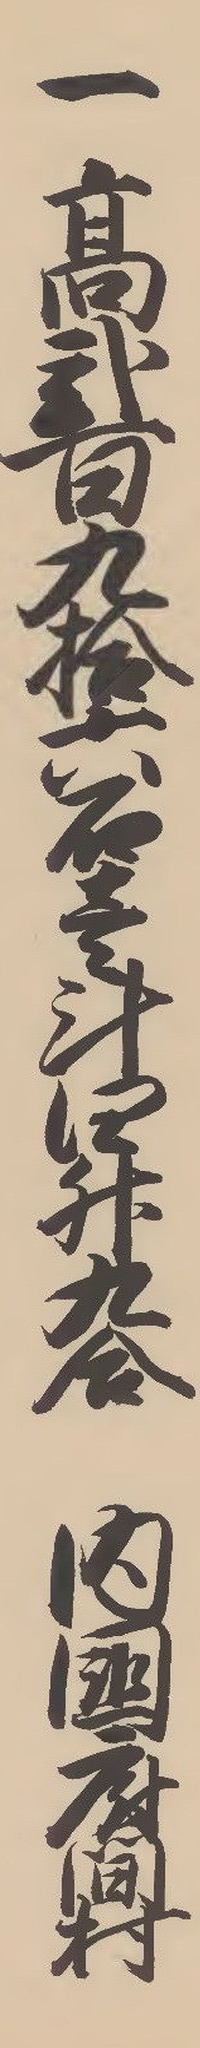一高弐百九拾六石壱斗四升九合内国府間村
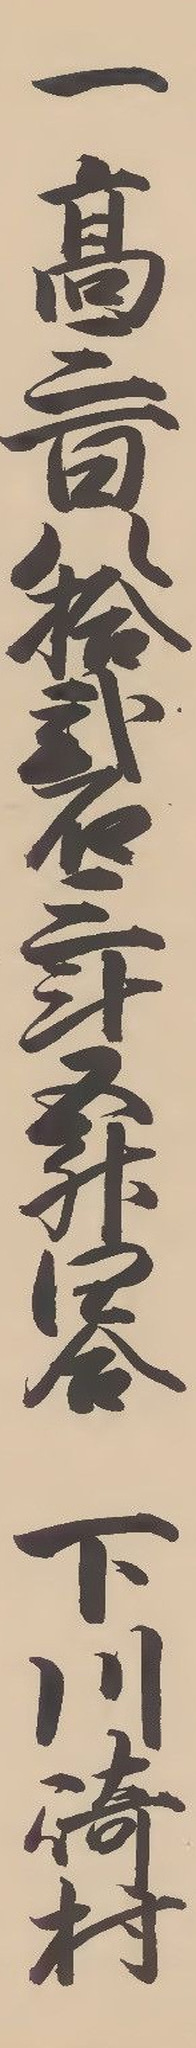一高三百八拾弐石三斗五升四合下川崎村
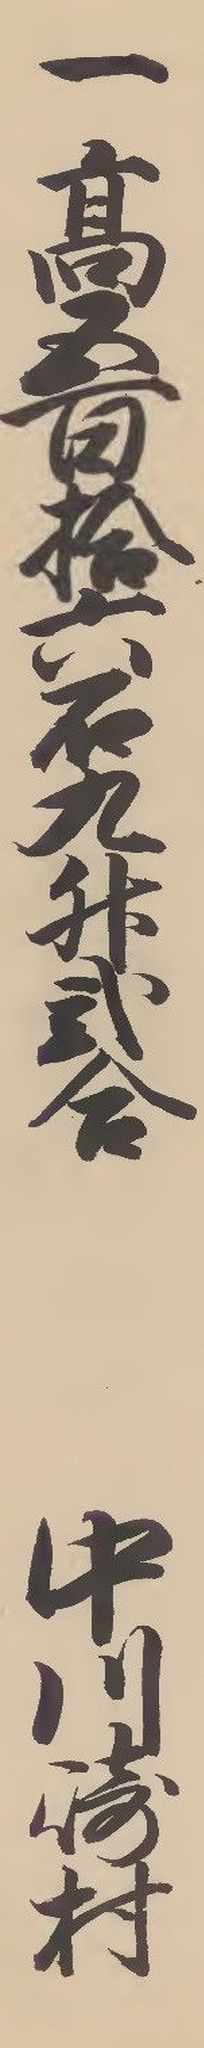一高五百拾六石九升弐合中川崎村

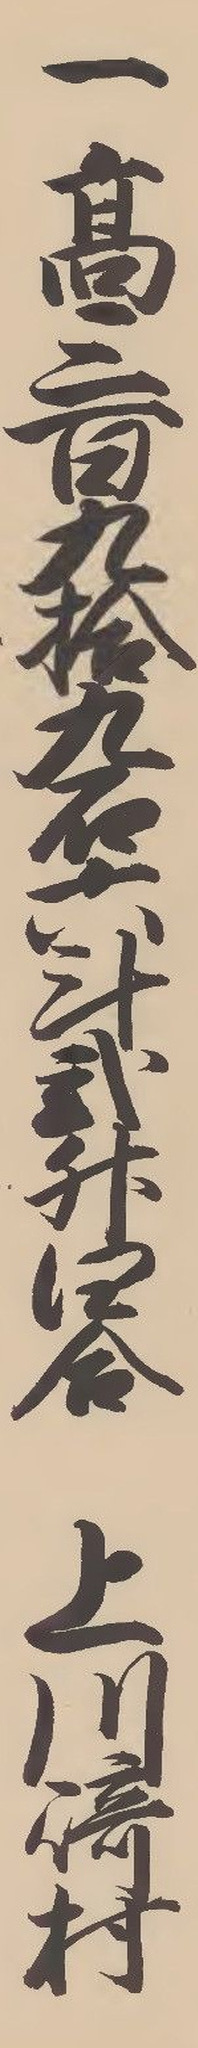一高三百九拾九石六斗弐升四合上川崎村
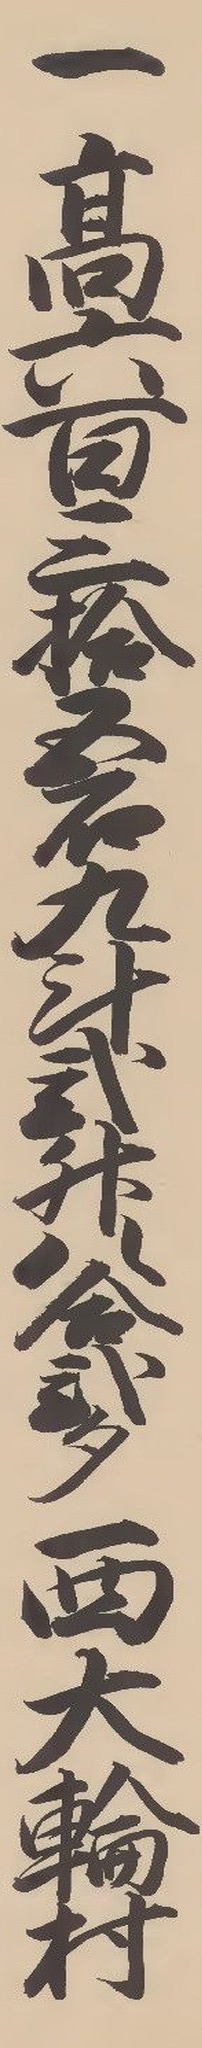一高六百三拾五石九斗弐升八合弐勺西大輪村
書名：武蔵国郷帳　下
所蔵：国立公文書館 National Archives of Japan
